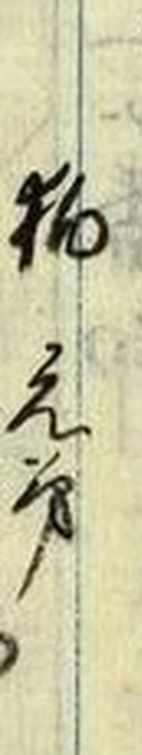狛元弟
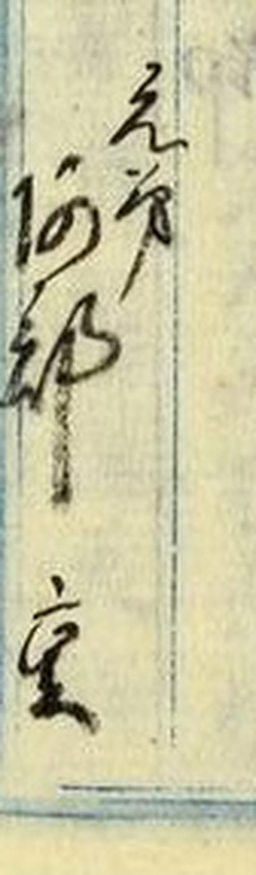阿部重
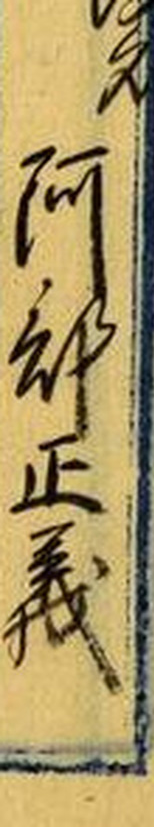阿部正義
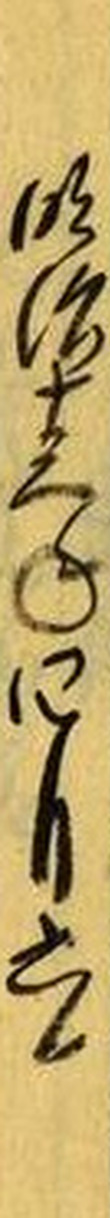明治十三年四月六日
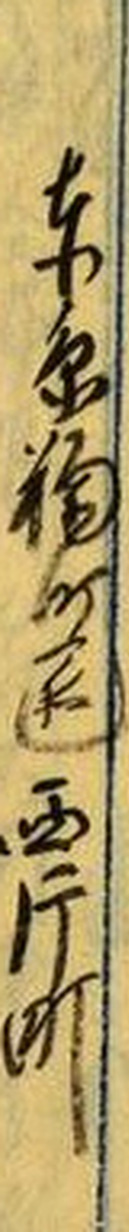東京麹町区西片町
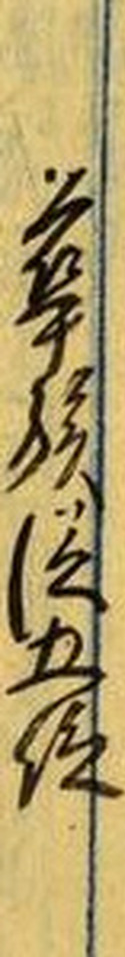華族従五位

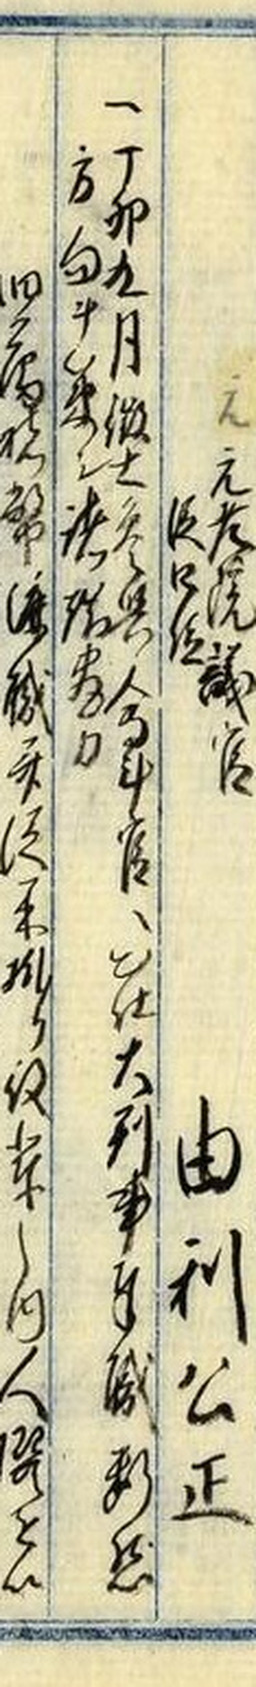一丁卯九月徴士参与会計官へ出仕大判事奉職断然
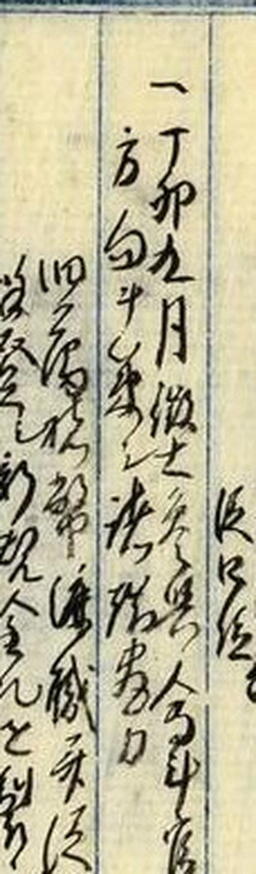方向ヲ策シ諸端尽力
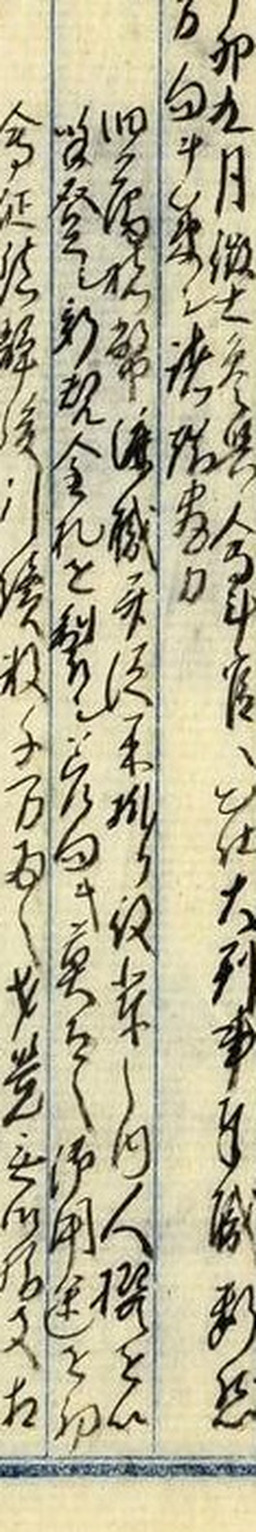旧藩諸幣漉職并従来掛り役輩之内人選を以
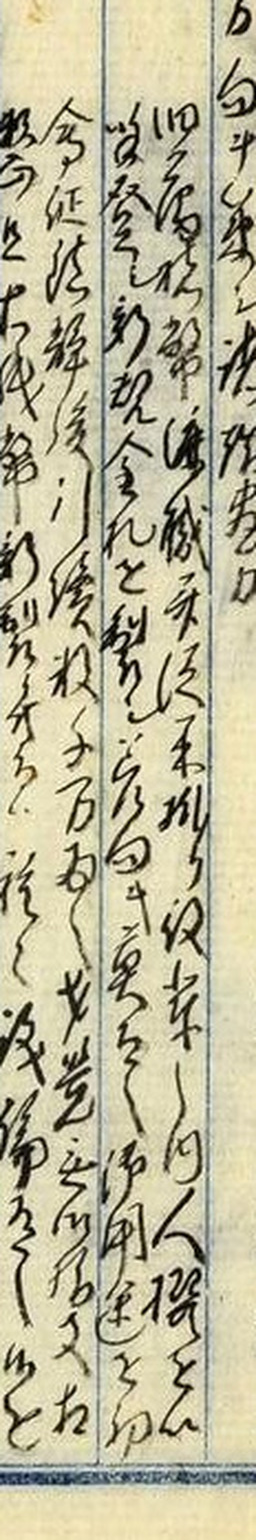呼登シ新規金札を製シ差向キ莫大之御用途を初
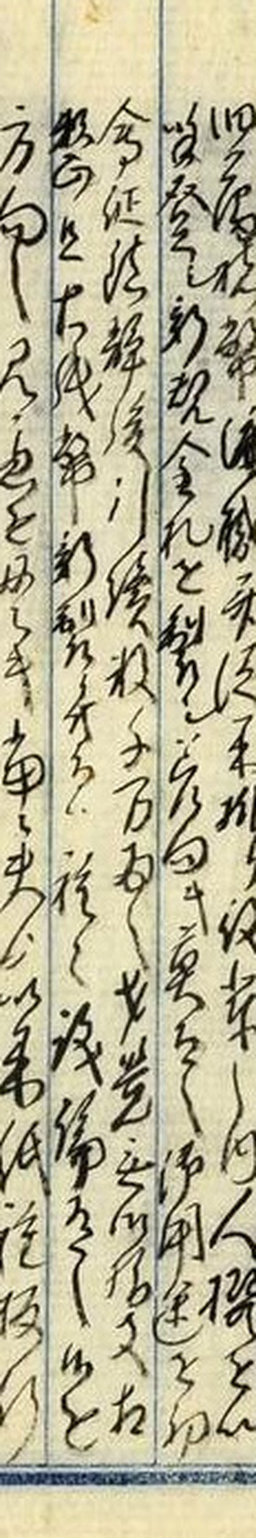会征鎮静後引続籾千万両之才覚無御指支相
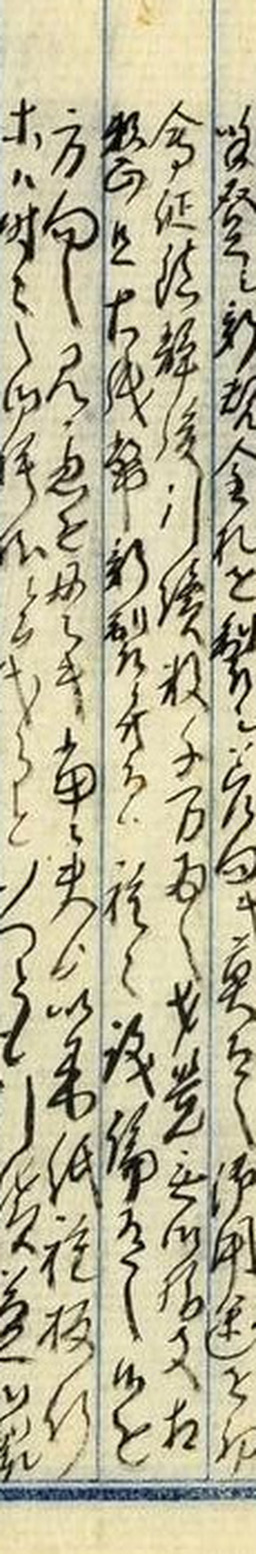整且右紙幣新製候付而ハ種々議論有之候を
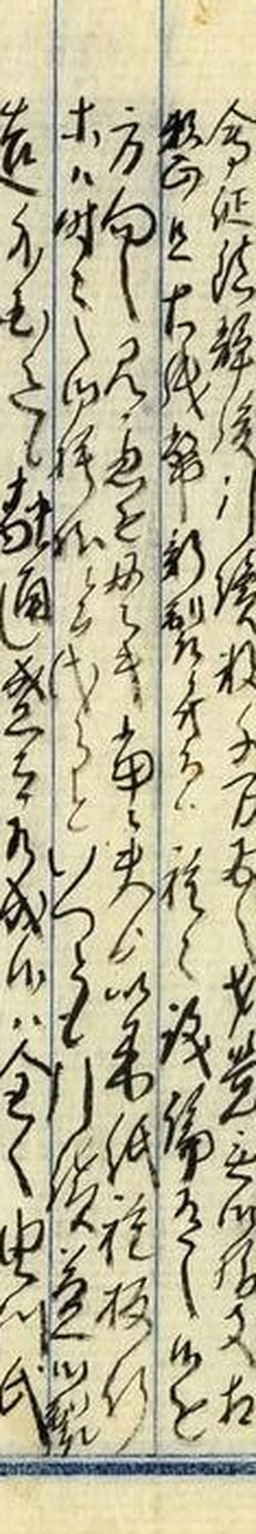方向之見当を毌らキ尚々夫ゟ以来紙種板行
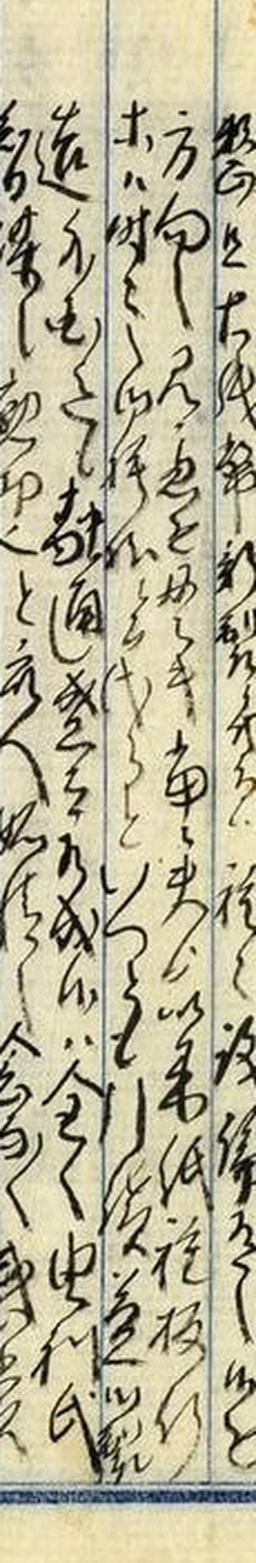等ハ時々之御模様ニ而代るといへとも引続益御製
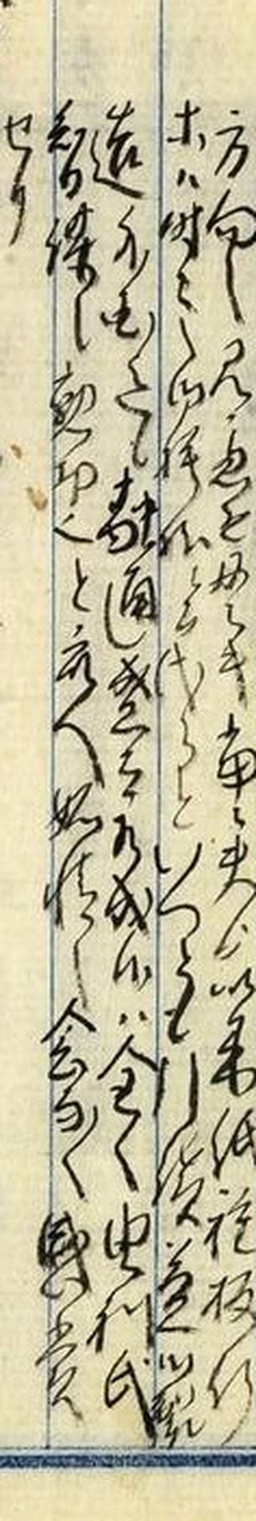造外国とも融通盛ニ相成候ハ全く由利氏
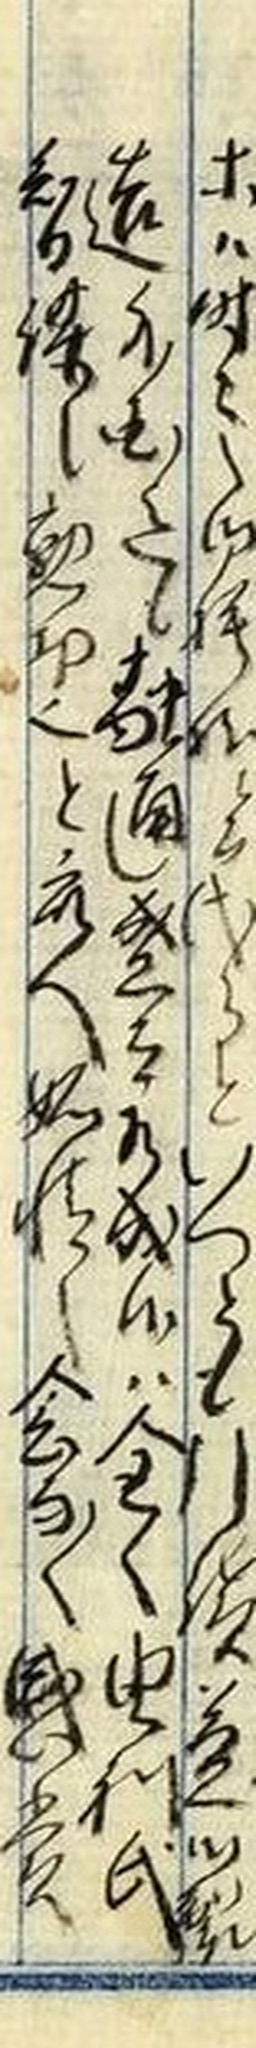智謀之勲功也と衆人妬情之念なく感賞
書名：温古集 三巻
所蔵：福井県文書館 Fukui Prefectural Archives
